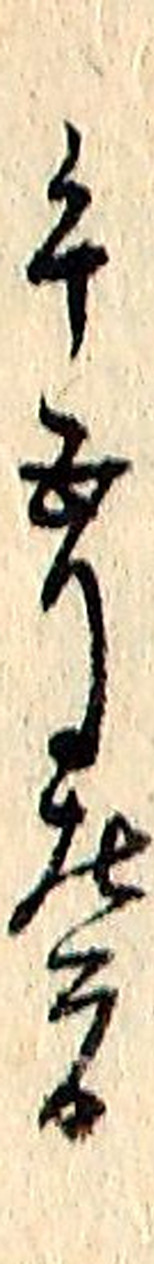午五月廿二日
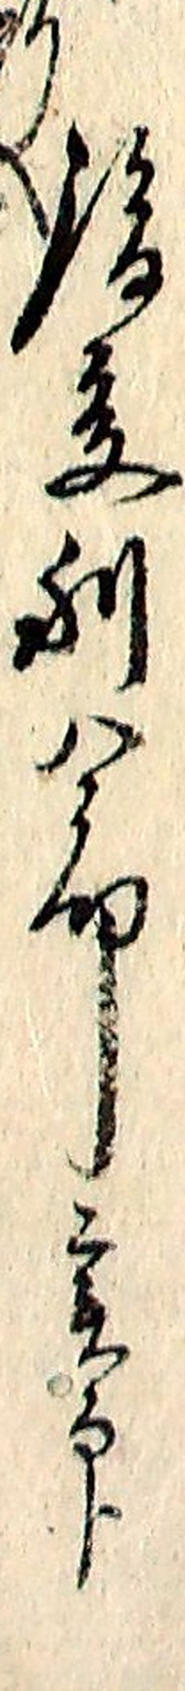後藤利八郎実印
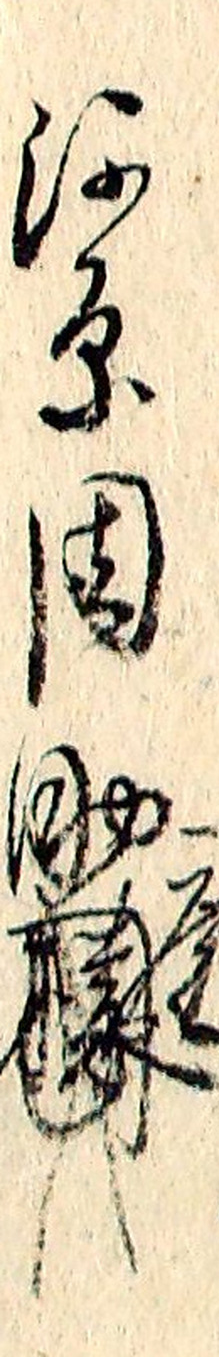河原周助印
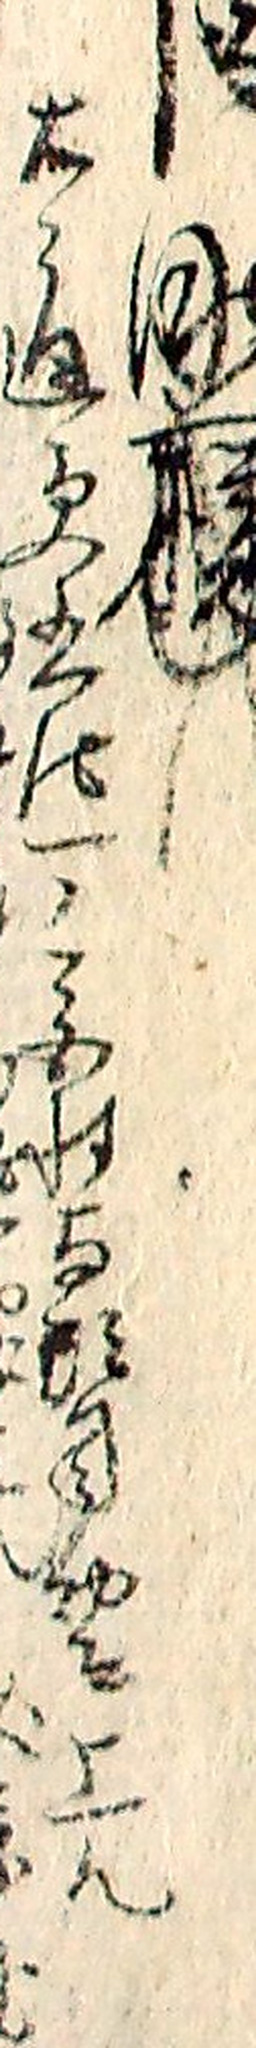右之通受書仕一ノ宮村与頭周助殿上る

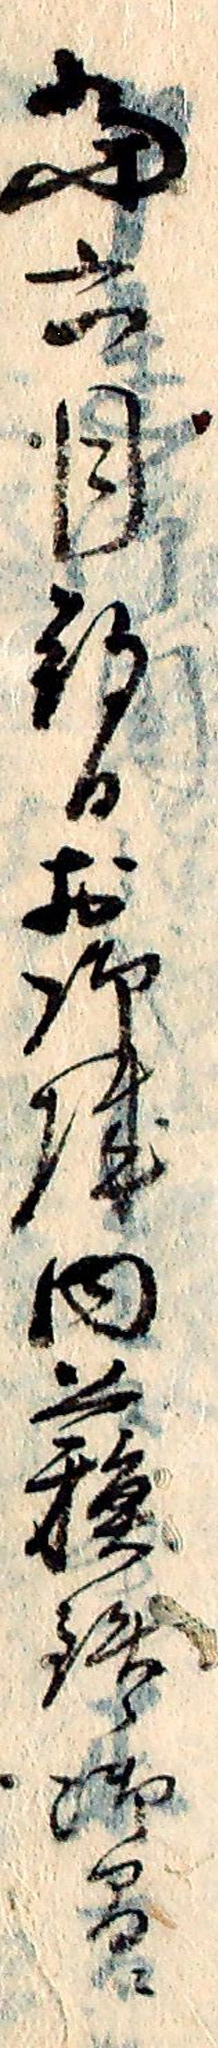当六月朔日於御城内蘇鉄之御間に
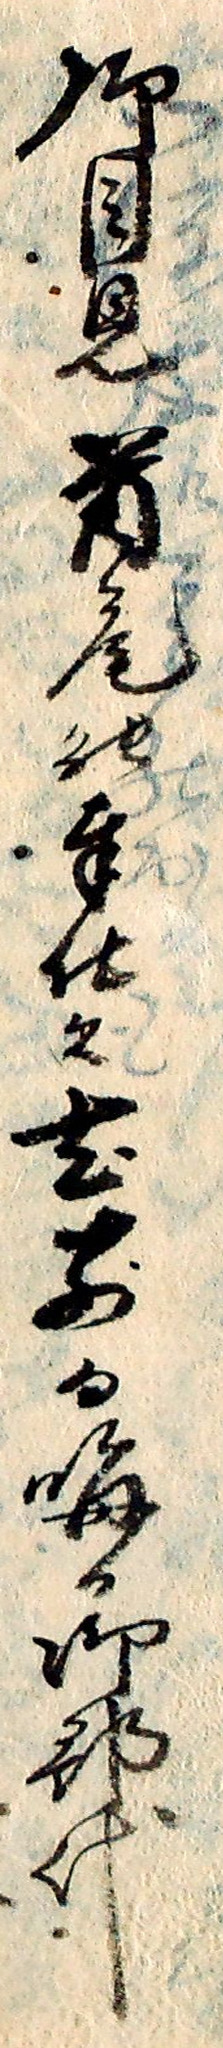御目見首尾能奉仕候尤前日晦日御郡代
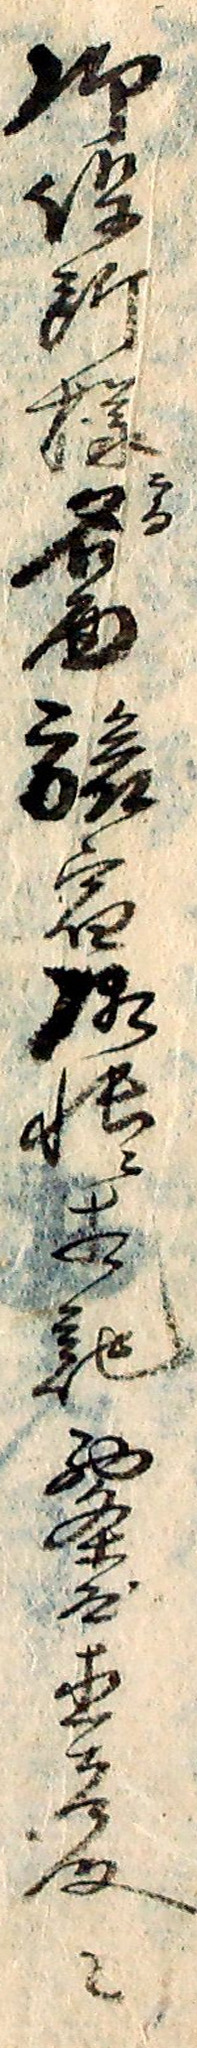御役所様にて名面旅宿御帳に相記西条屋直吉殿に
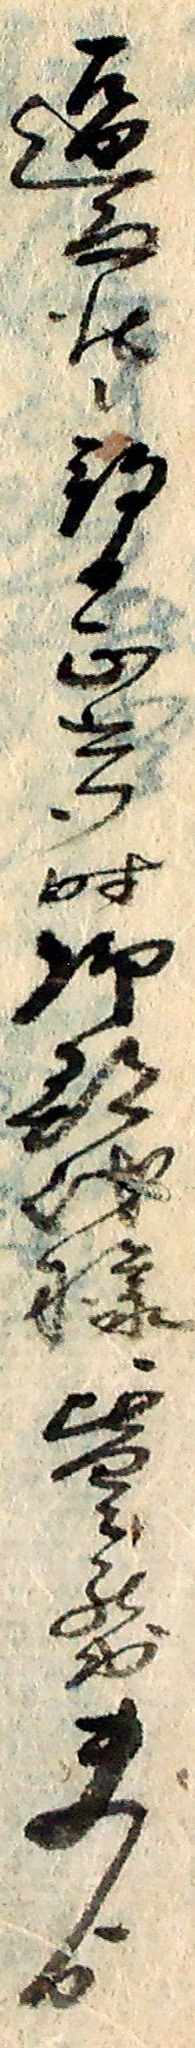逗留仕候朔日正六つ時御郡代様へ皆々罷出夫ゟ
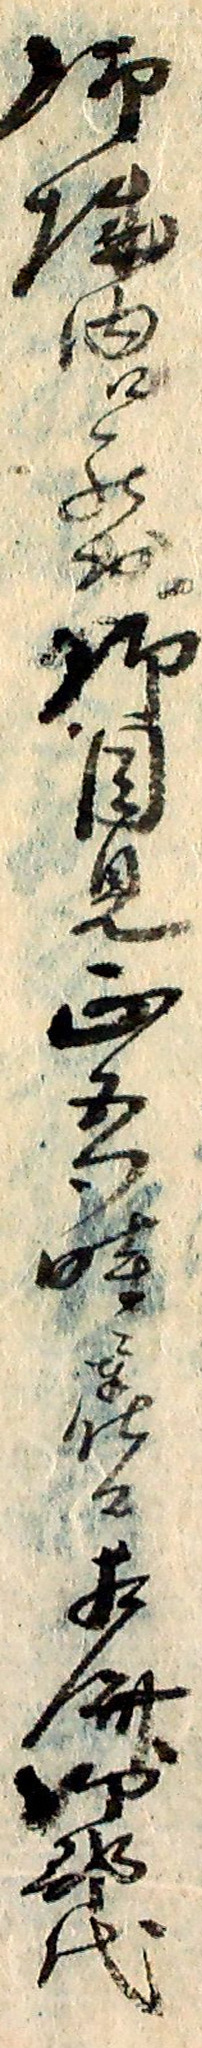御城内え罷出御目見正五つ時に奉仕候相済御郡代
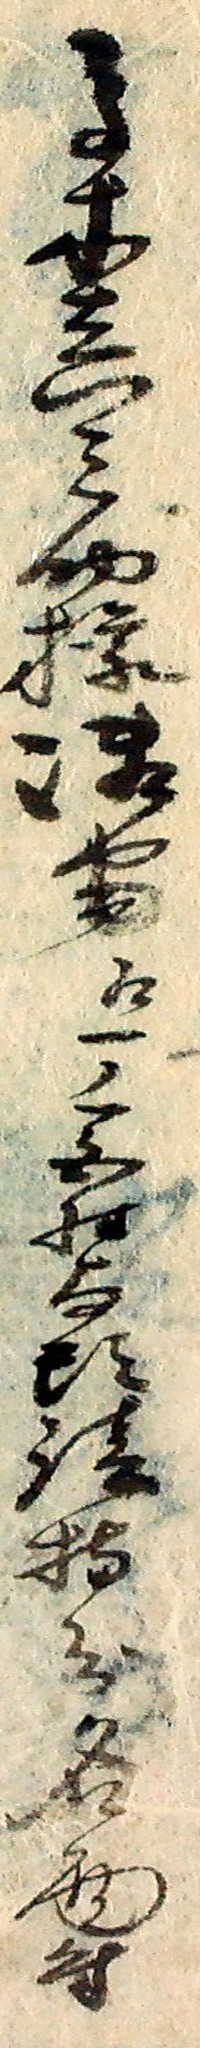高木真之助様御宅え一ノ宮村与頭請持分名面付
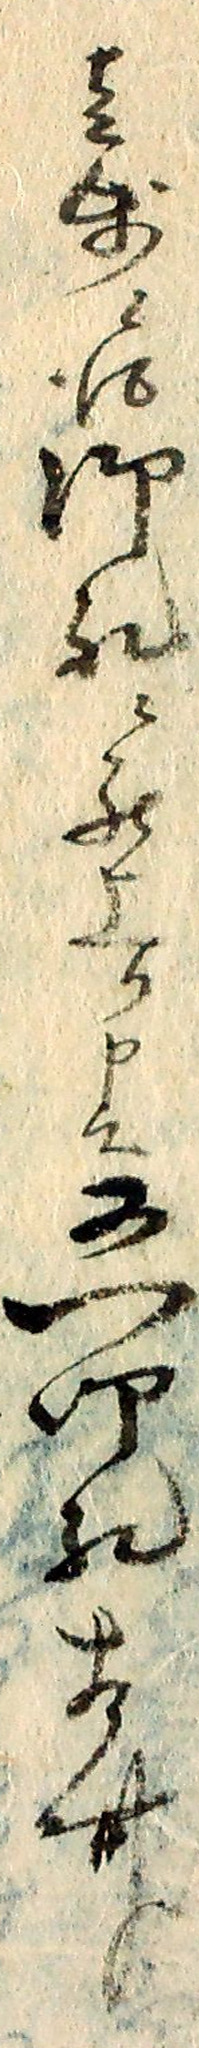壱紙に仕御礼に罷上り申候右御礼相済
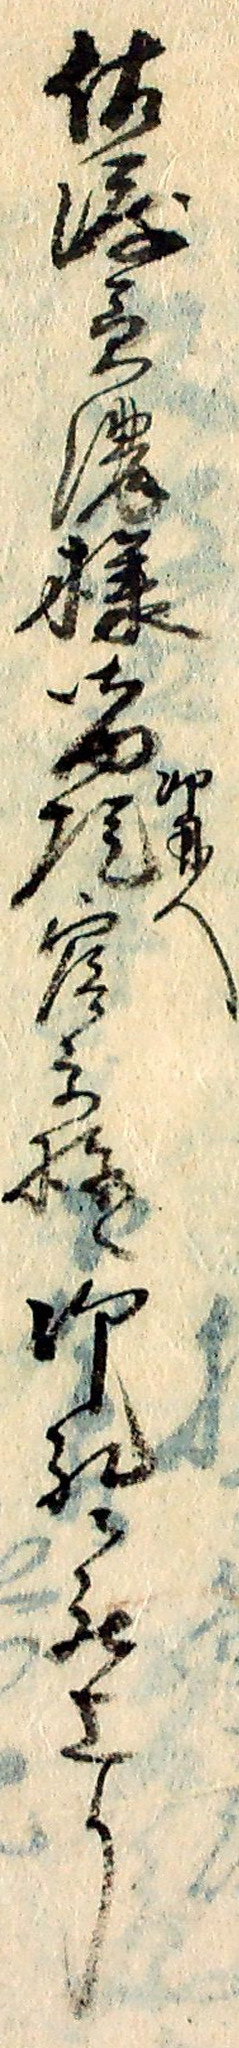佐渡美濃様御内御用人堤官兵衛様へ御礼に罷上り
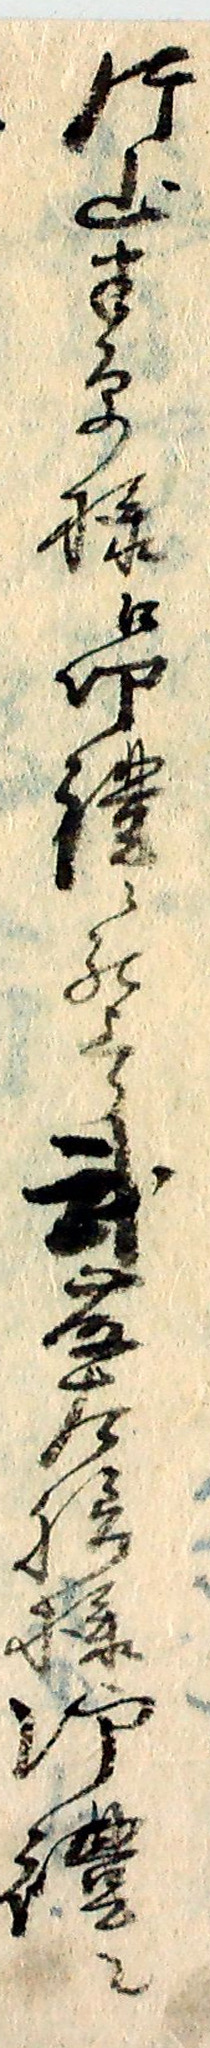片山半兵衛様え御礼に罷上り武藤左膳様御礼に
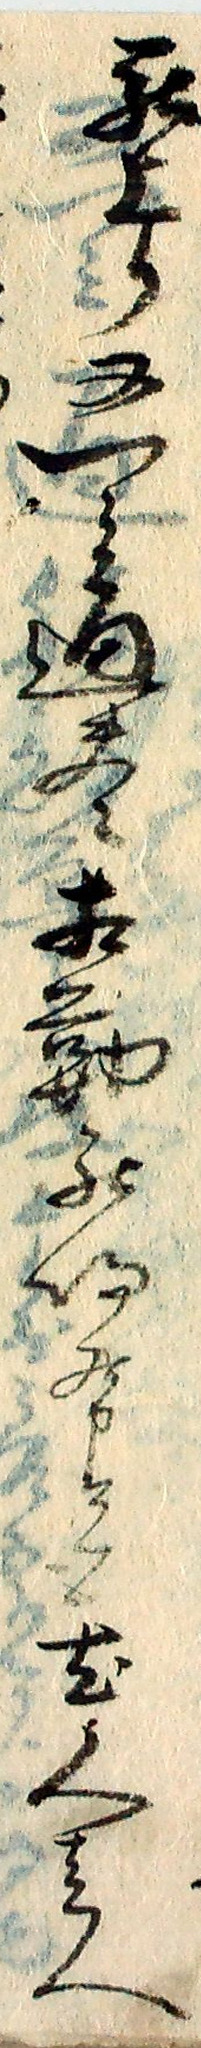罷上り右之通夫々相勤罷帰居申候以上尤人壱人

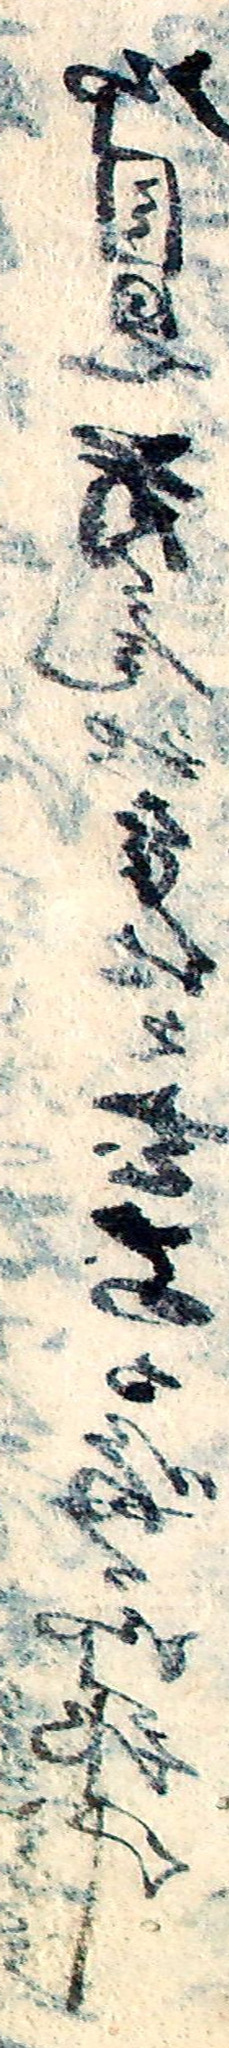六月廿五日
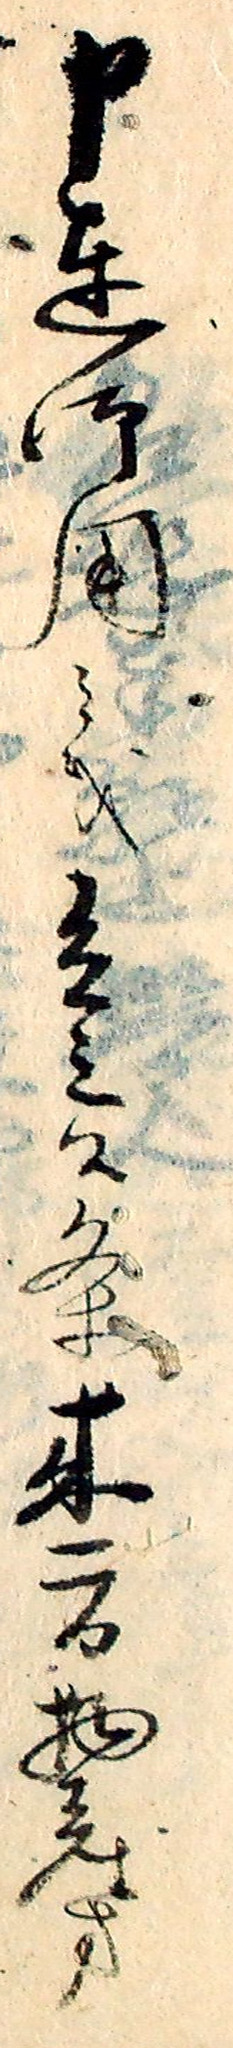申達御用之義有之候条来二日物産方
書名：諸御願書控(後藤氏壱番）
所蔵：鳴門教育大学 Naruto University of Education
